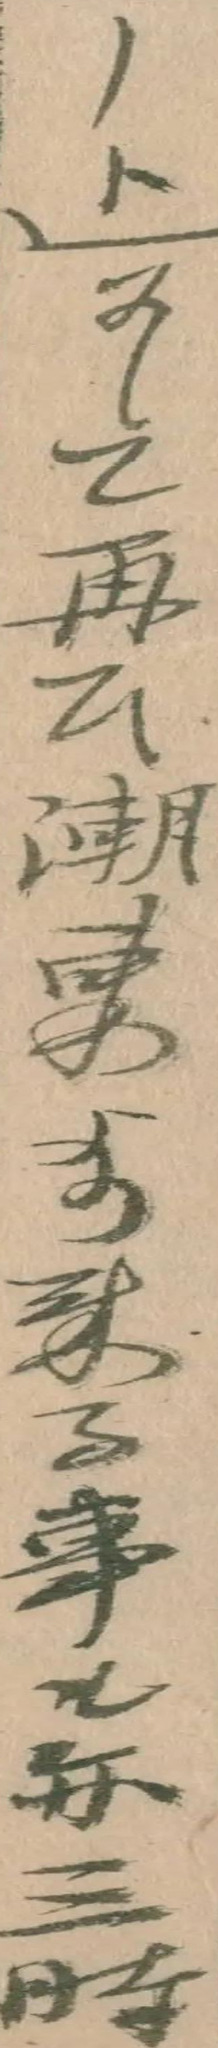ート)にして再ひ潮東より来る事も亦三時
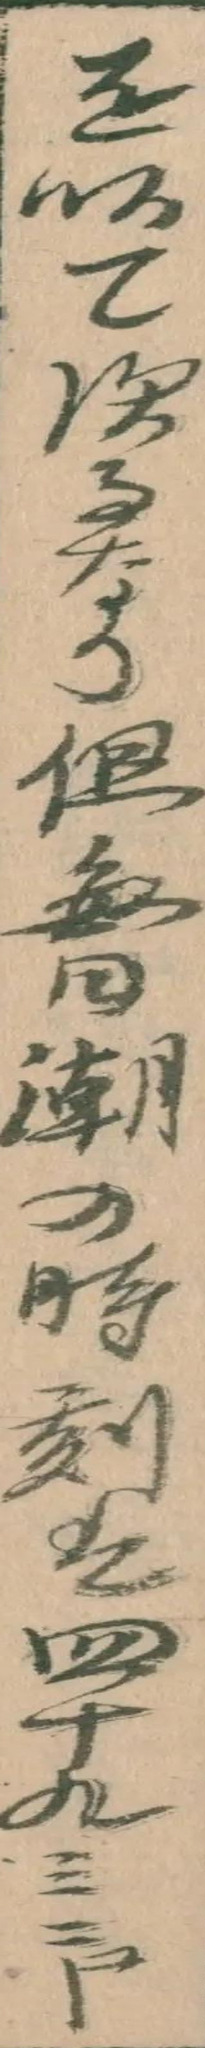を以てするなり但毎日潮の時刻は四十九ミニュー
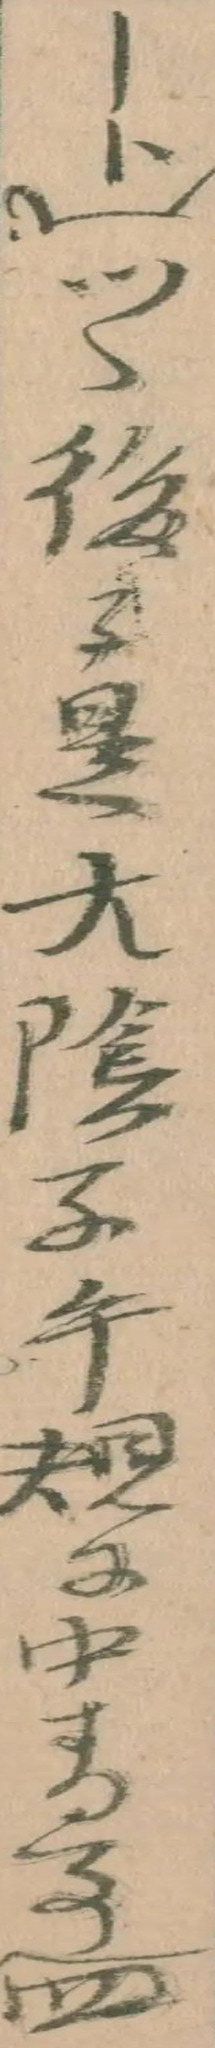ート)ツヽ後る是大陰子午規に中する事(四
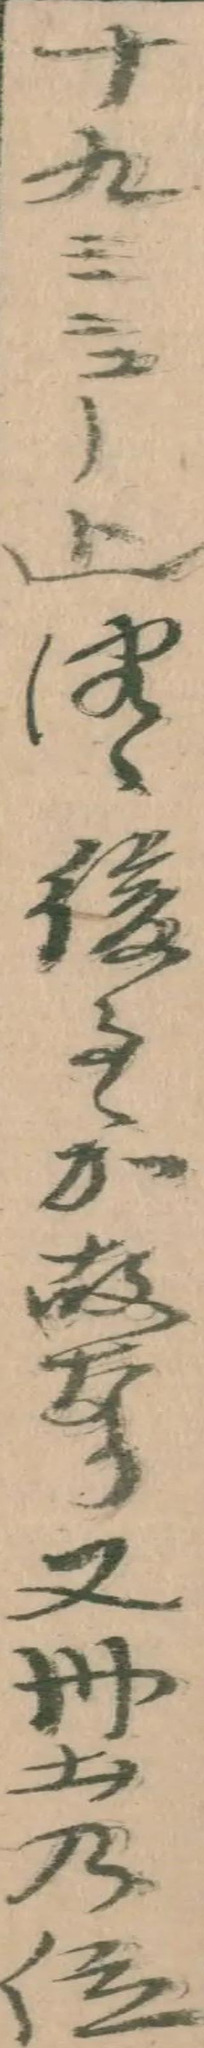十九ミニュート)つゝ後るゝか故なり又州土の位
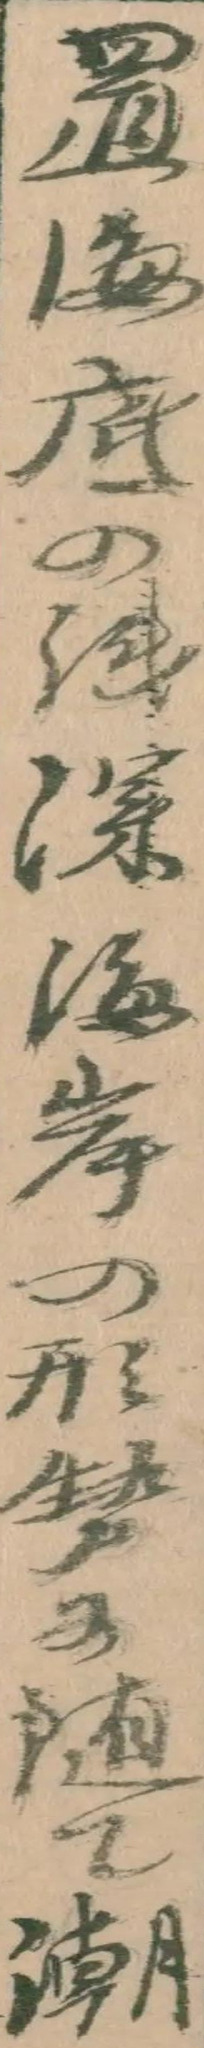置海底の浅深海岸の形勢に随て潮
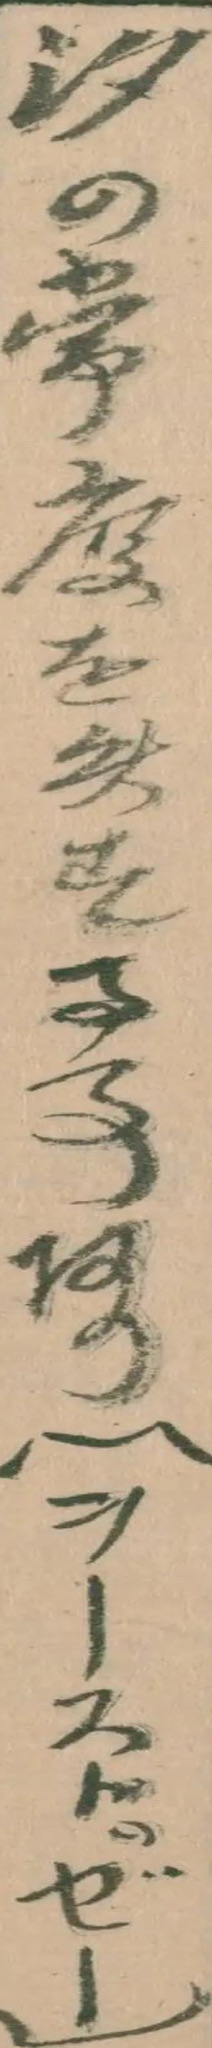汐の常度を失する事あり(ヲースト・ゼー)
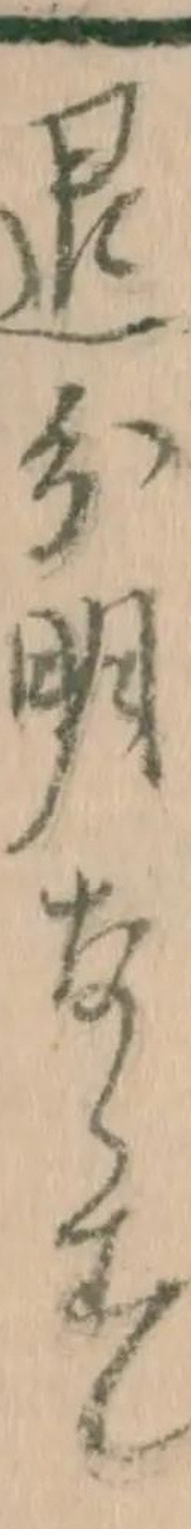退分明ならす
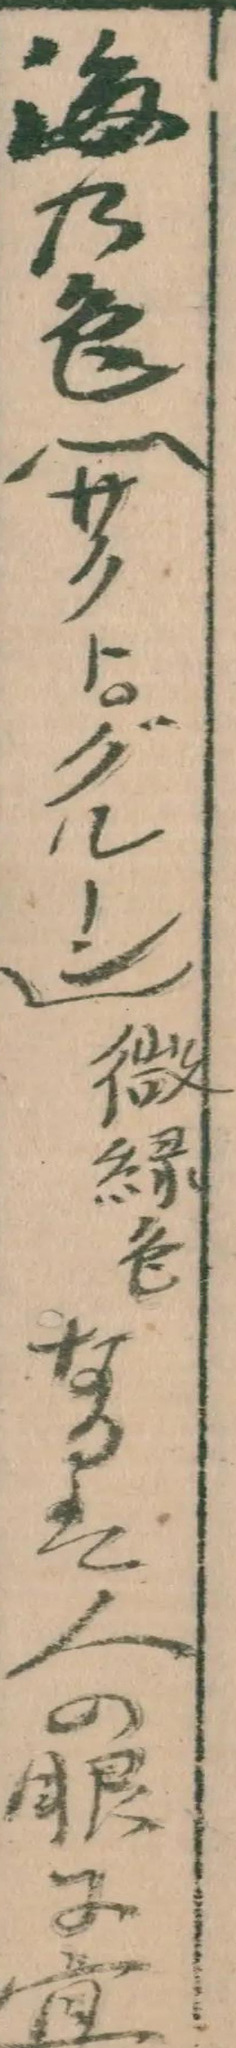海の色(サクト・グルーン)微緑色なるは人の眼に宜
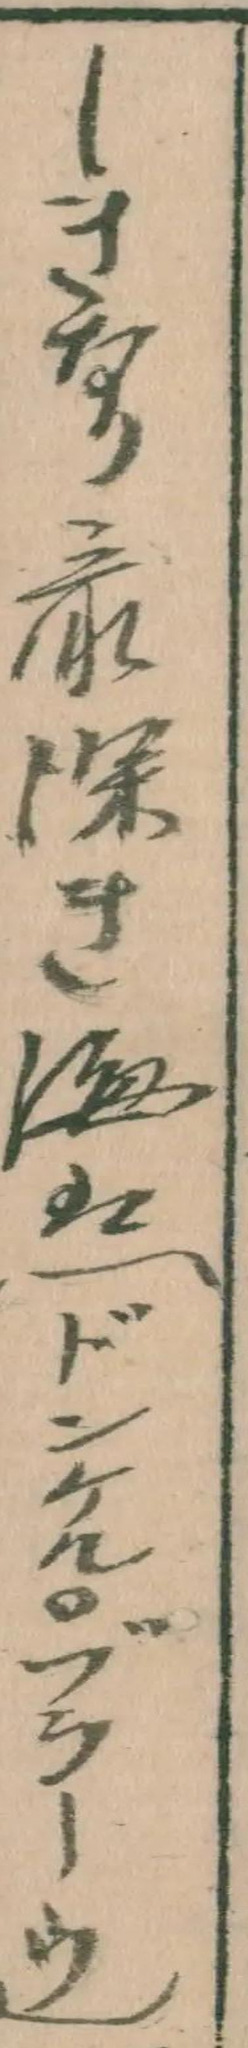しきなり最深き海は(ドンケル・ブラーウ)暗黒色
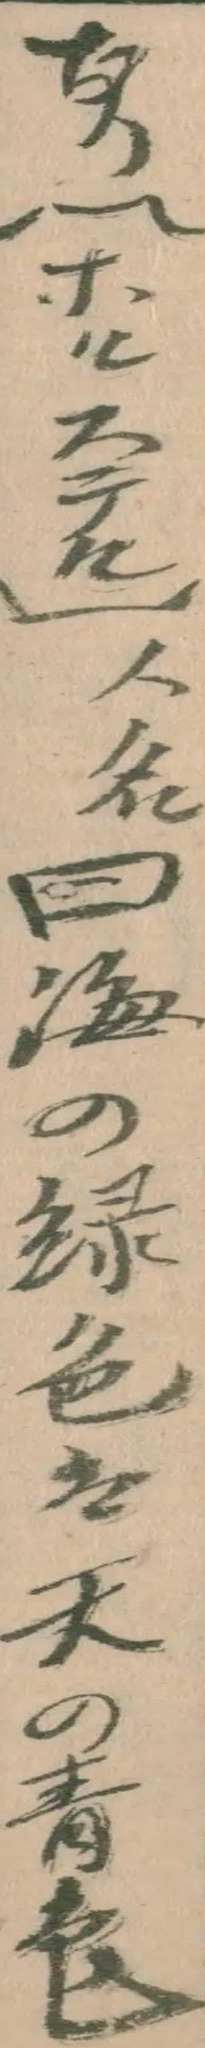なり(ホルステル)人名曰海の緑色は天の青色
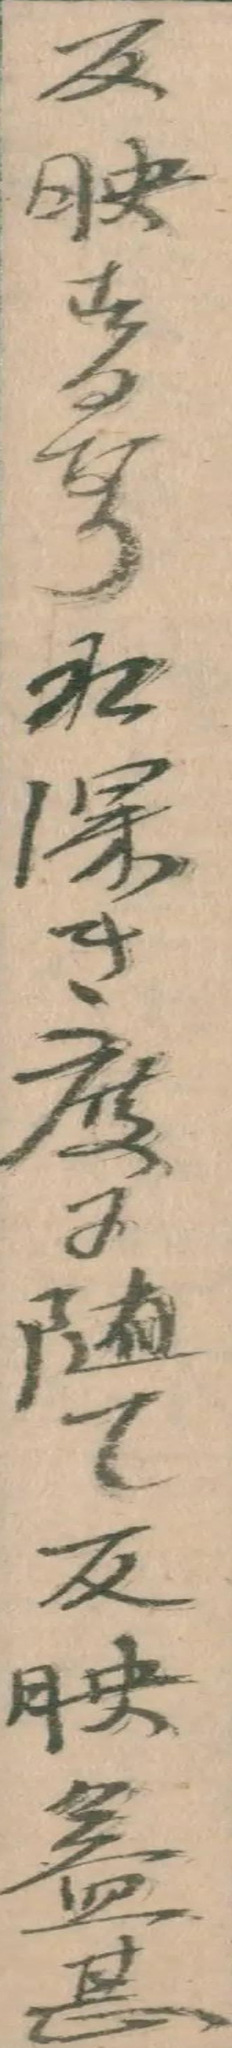反映するなり水深き度に随て反映は益甚
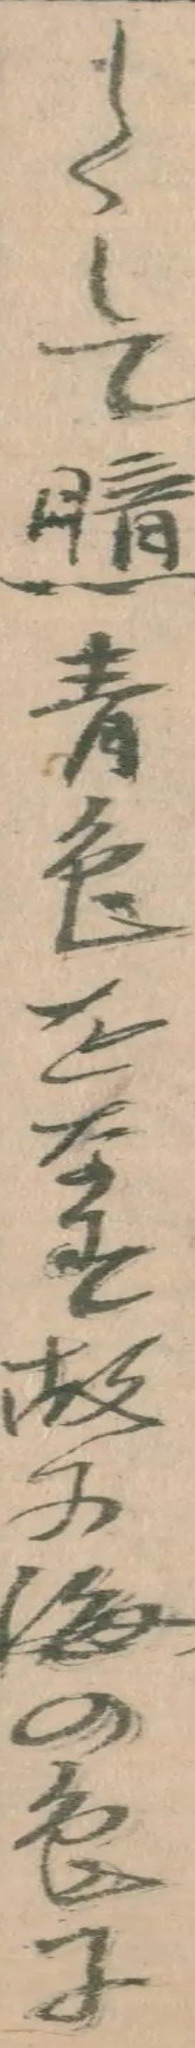しくして青色をなす故に海の色に
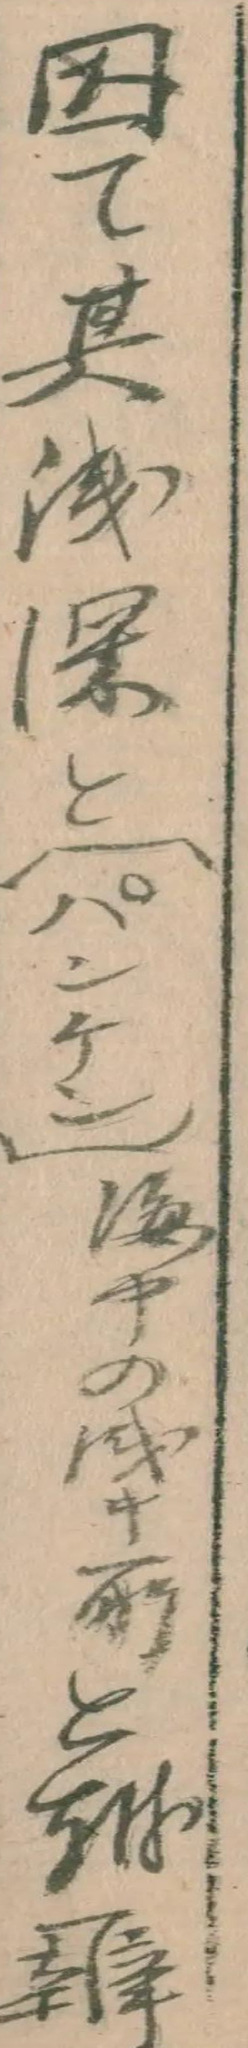因て其浅深と(パンケン)海中の浅き所と雖弁
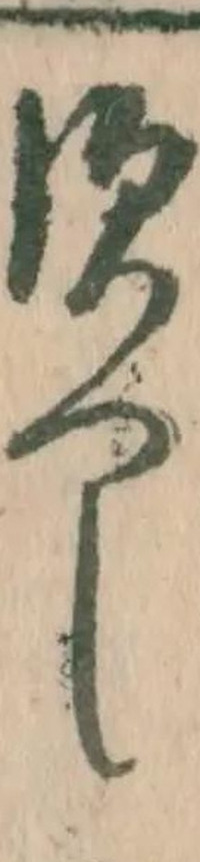すへし
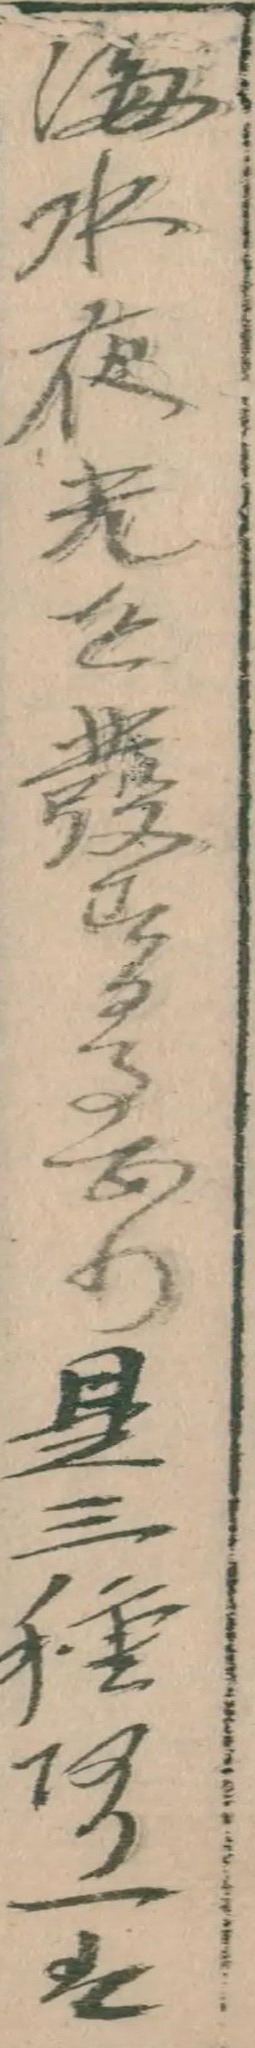海水夜光を発する事あり是三種あり一は

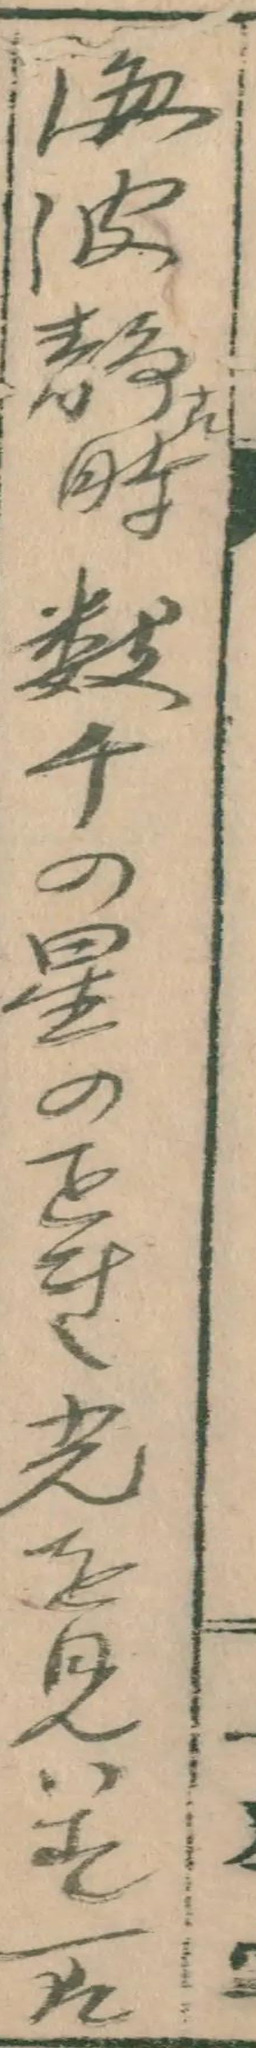海波静ナル時数千の星のことき光を見いす一は
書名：新釈輿地図説
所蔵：国立国会図書館 National Diet Library, JAPAN
